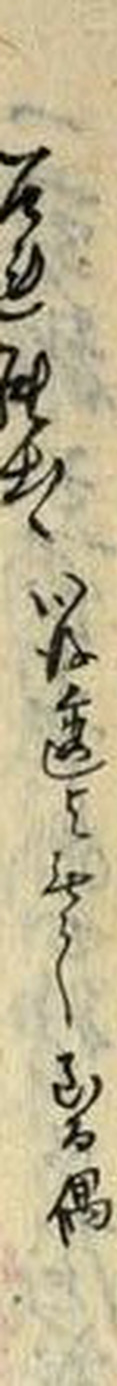召連罷出候以後透与無之至而偶
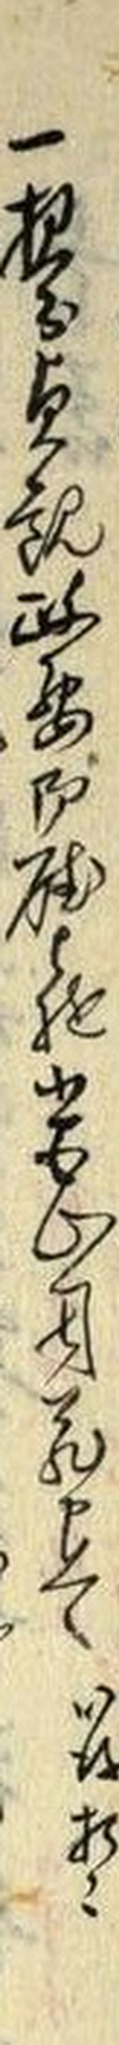一夜分貞観政要御聴被遊小宮山周蔵申上候以後折々
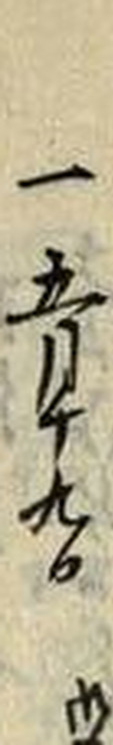一五月十五日
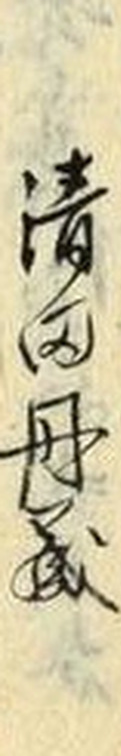清田丹蔵
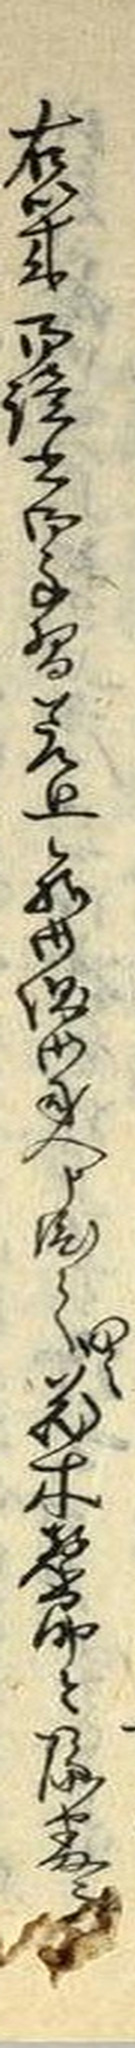右以来御読書御手習差上候様御側御用人申渡之仍之花木馨助と隔番ニ
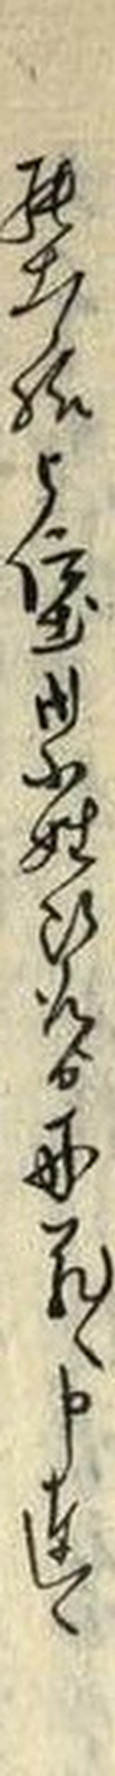罷出候様被仰出御小姓頭取ゟ丹蔵へ申達候
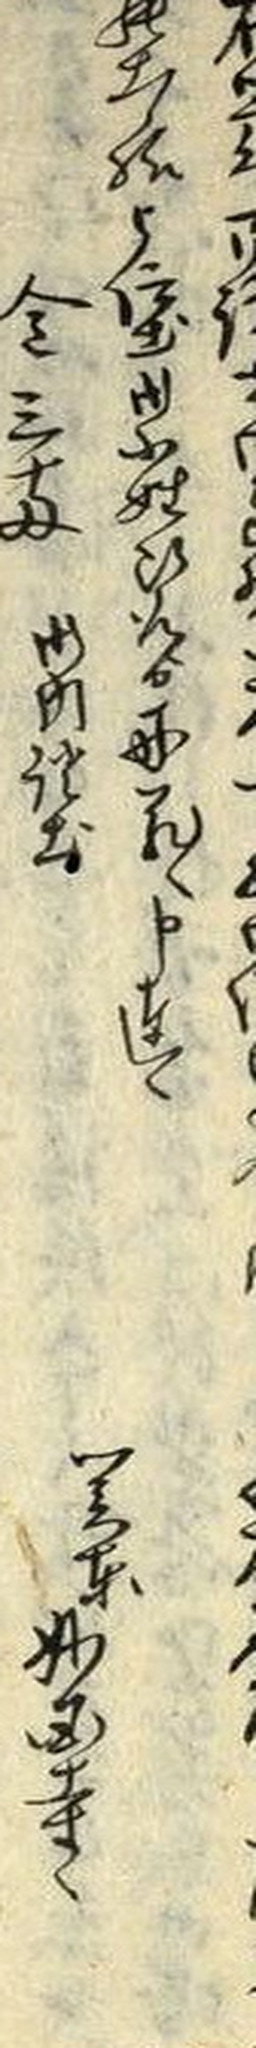金三両御内証出関東妙国寺へ
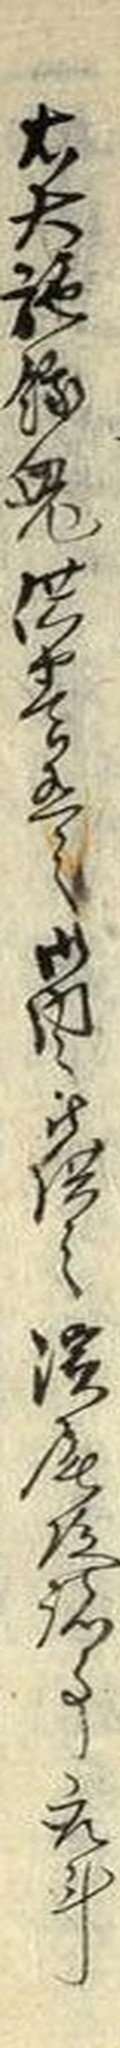右大施餓鬼供養有之御内々被供之浜尾殿諸事取斗
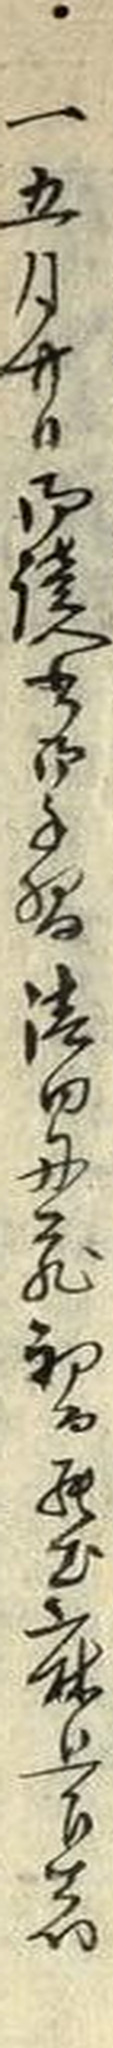一五月廿日御読書御手習清田丹蔵初而罷出麻上下着
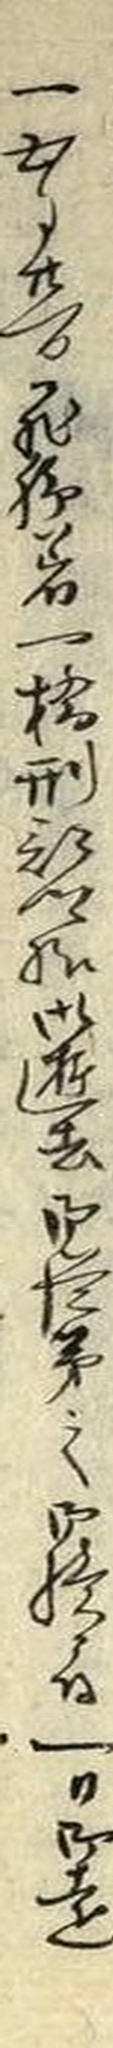一五月廿一日飛脚着一橋刑部卿様御逝去御従弟之御続ニ付一日御遠
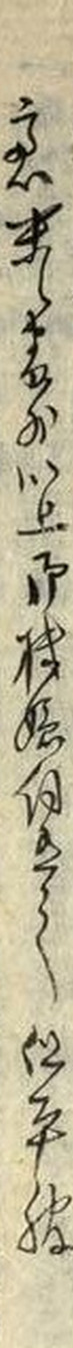慮未之番外以上御機嫌伺有之但平服
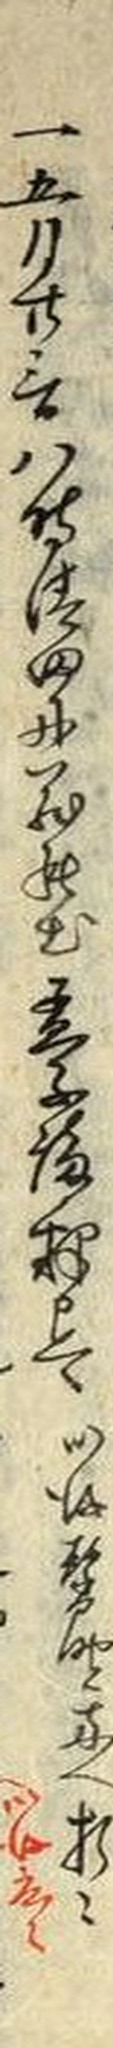一五月廿三日八時清田丹蔵罷出孟子講釈申上候以後馨助と両人折々
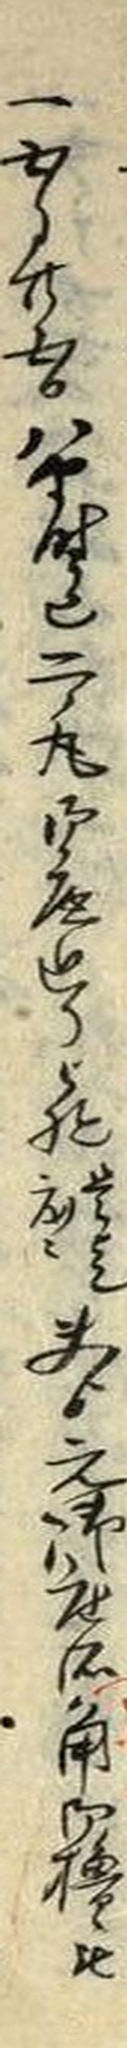一五月廿五日八半時過ニノ丸御庭廻り被遊是迄度々夫ゟ元御座所角御櫓へ被
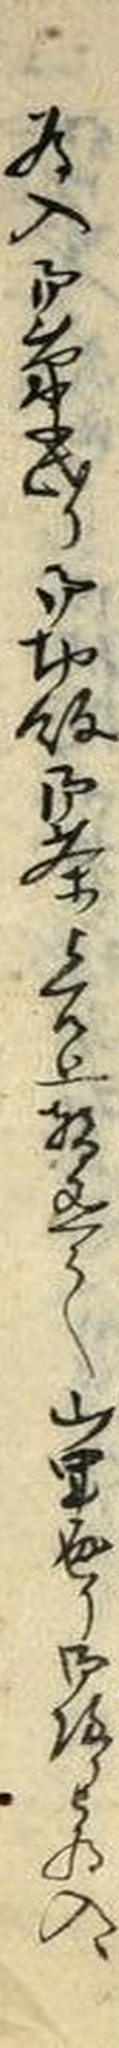為入御菓子代り御切飯御茶被召上暫有之山里通り御帰り被為入候

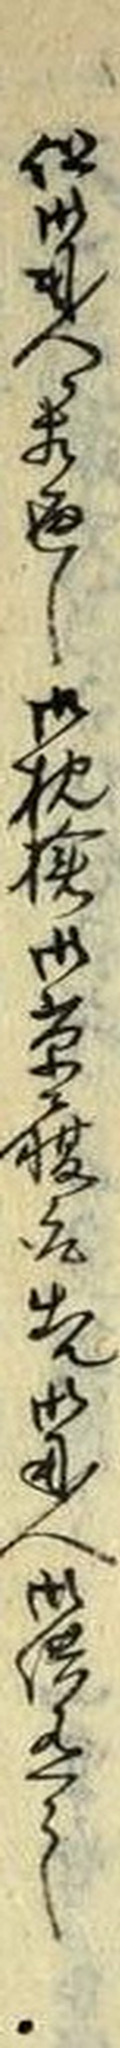但御用人へ相通し御枕槍御草履取出ル御用人御供有之
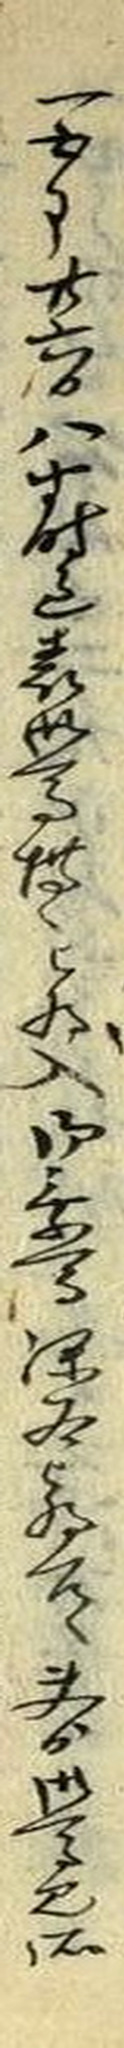一五月廿六日八半時過表御馬場へ被為入御乗馬深谷被為召候夫ゟ御馬見所
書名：少傅日録抄（斉善付側向頭取日記、江戸并道中、初入在国、逝去後…
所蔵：福井県文書館 Fukui Prefectural Archives
